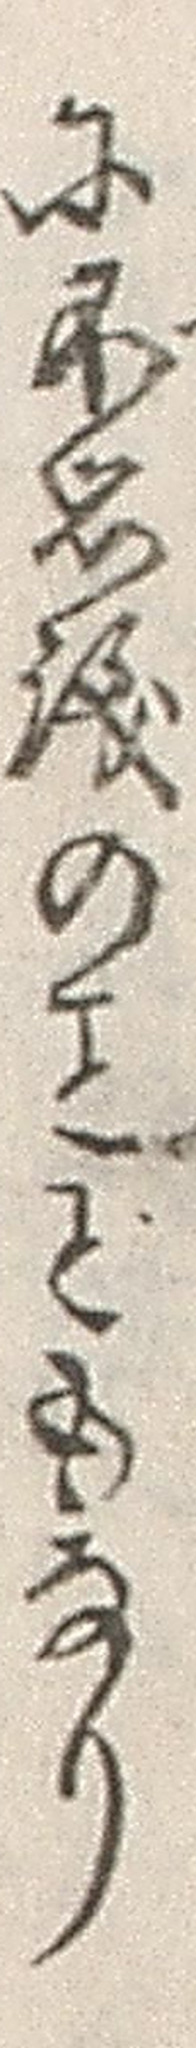に不思議のこととなり
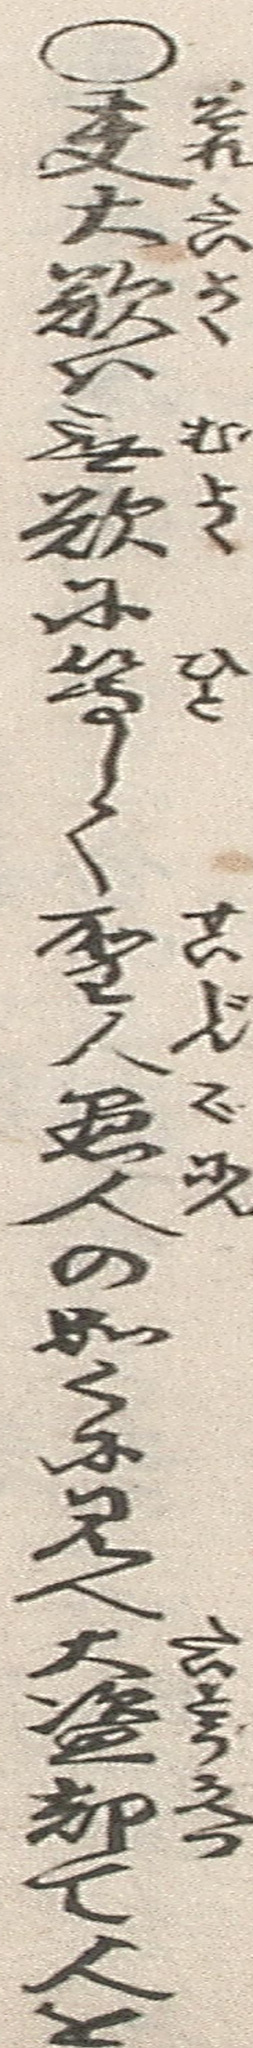◯夫大欲ハ無欲に等しく聖人愚人の如くに見ㇸ大盗却て人を
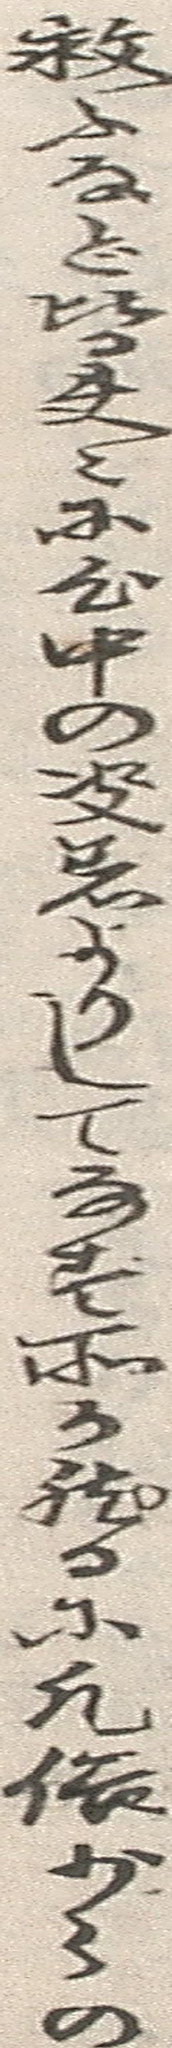救ふなど皆夫々に心中の決着よりしてなす所か然るに凡俗少々の
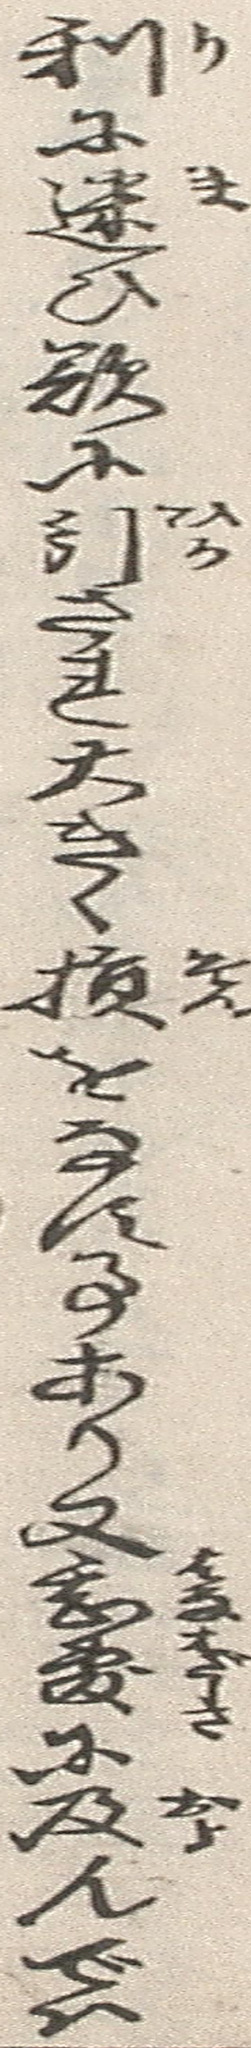利に迷ひ欲に引され大きく損をなす事あり又甚敷に及んでハ
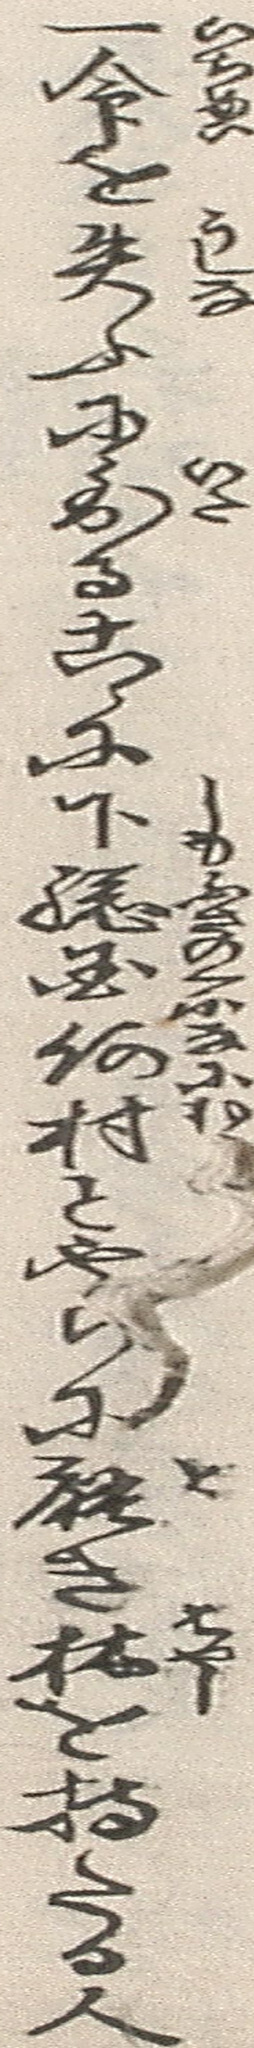一命を失ふに至るこゝに下総国何村とやらに能き林を持たる人
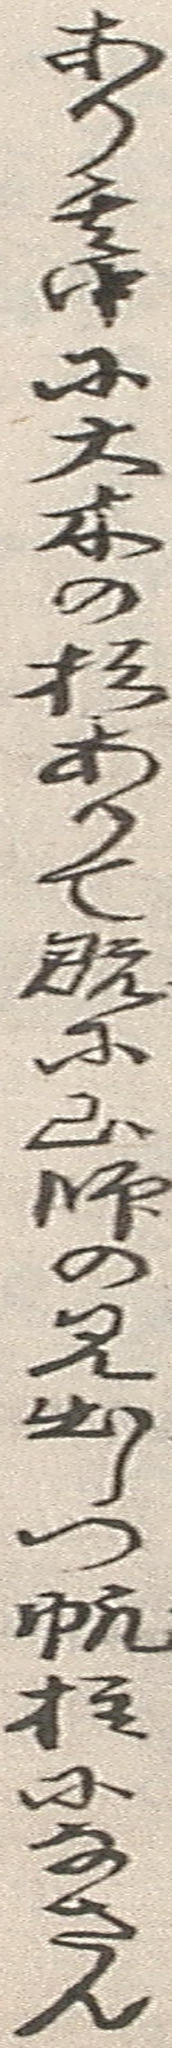あり其中に大木の杉ありて既に山師の見出しつ帆柱になさん
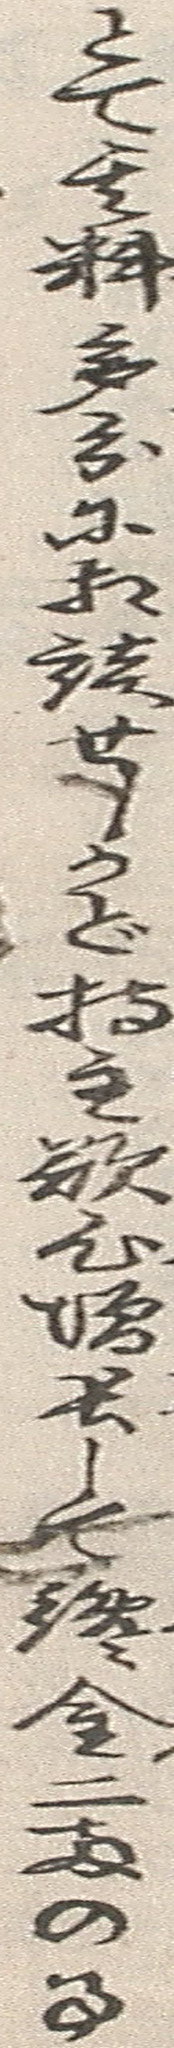とて其料多分に相談せしかど持主欲心増長して纔金二両の事
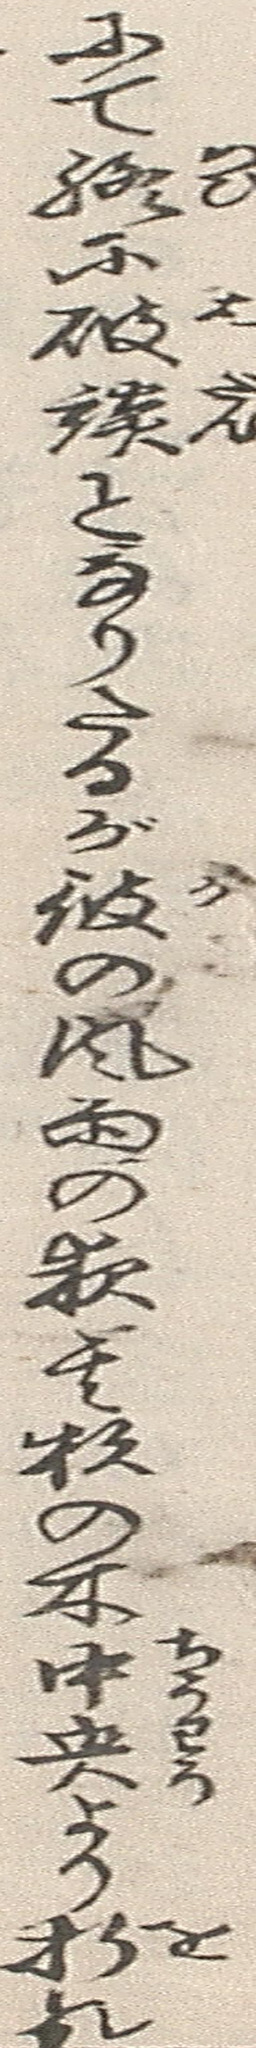にて終に破談となりたるが彼の風雨の夜其杉の木中央より折れ
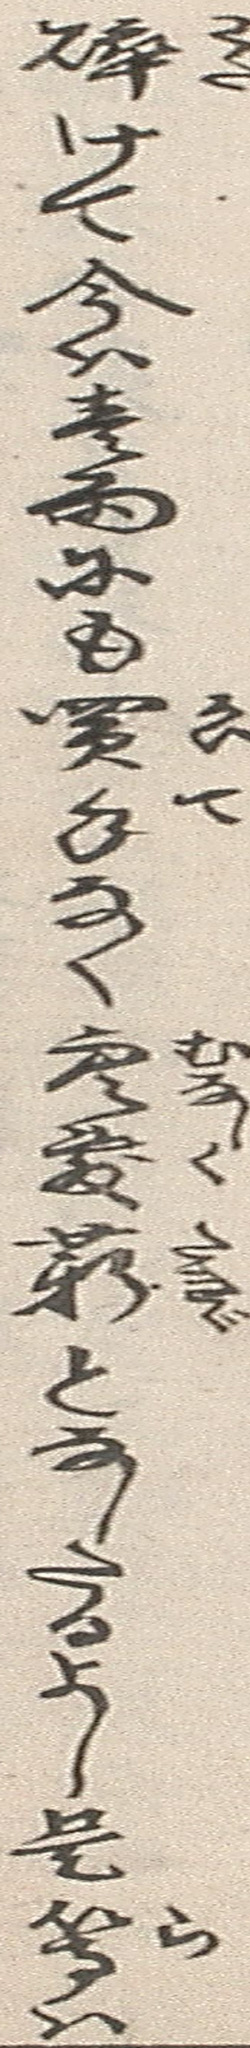砕けて今ハ壱兩にも買手なく空敷薪となりたるよし是等ハ
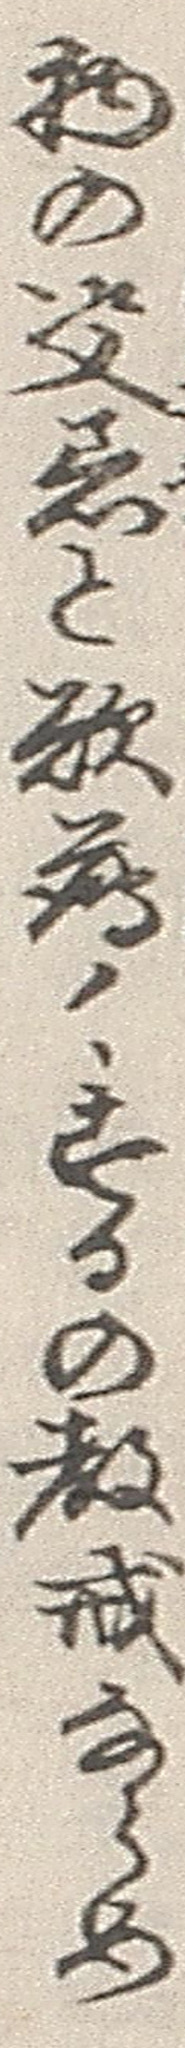物の決着と欲薄くするの教戒ならめ
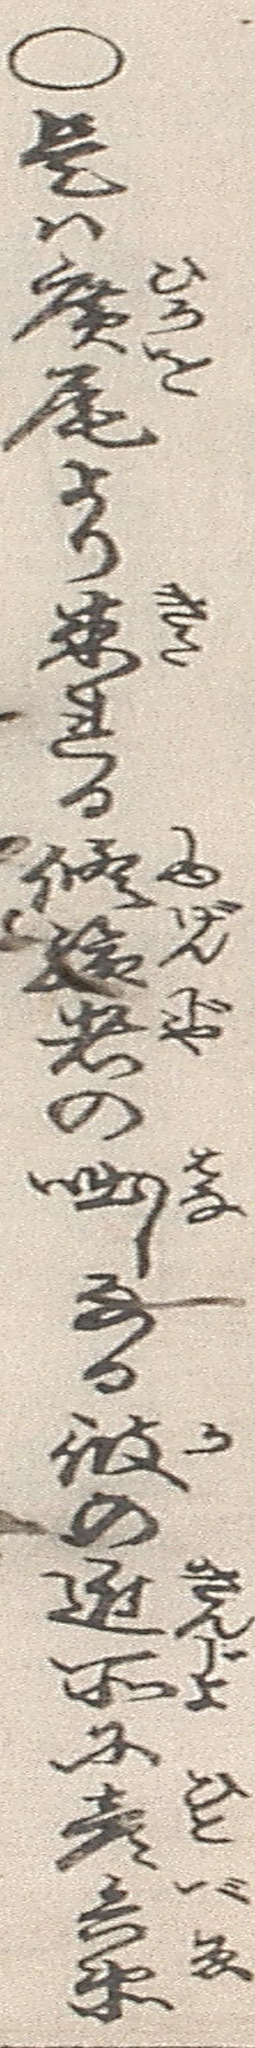◯是ハ広尾より来れる修験者の咄なる彼の近所に彦兵衛
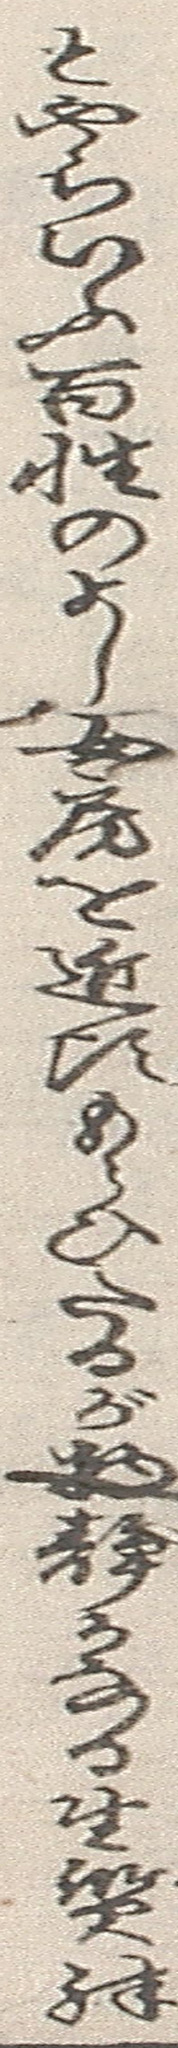とやらいふ百性のよし女房を近頃もらひたるが物静かなる生質殊
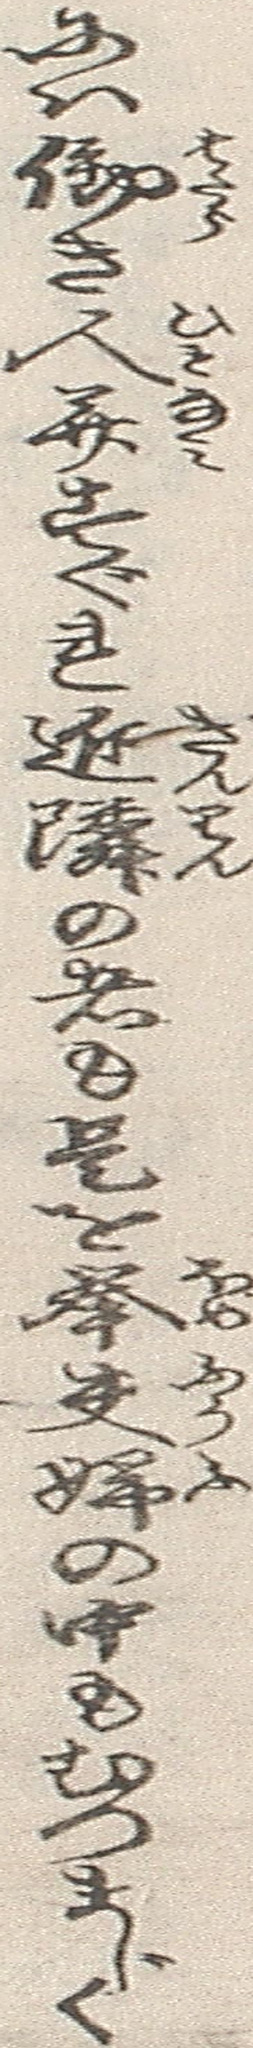にハ働き人並すぐれ近隣の者も是を挙夫婦の中もむつまじく
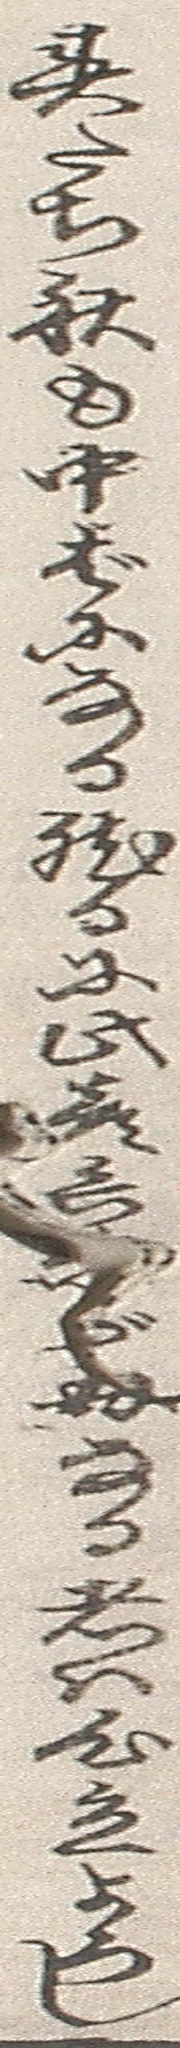英たち秋も中ばになる然るに此彦兵衛が母なる者ハ心立よろし
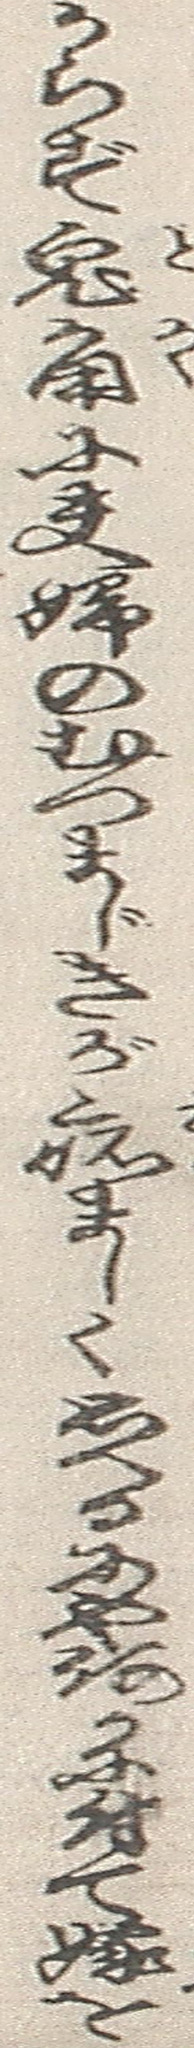からず兎角に夫婦のむつまじきが疾ましく思へるにや何かに付て嫁を
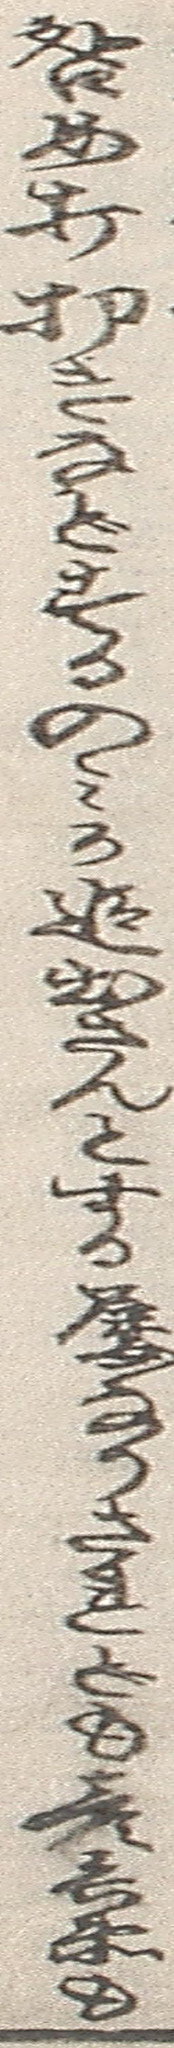咎め打叩きなどするのミか追出さんとする屡なりされども彦兵衛も
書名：安政風聞集　上中下　全
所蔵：東京大学地震研究所図書室 Earthquake Research Institute Library, The University of Tokyo, JAPAN
